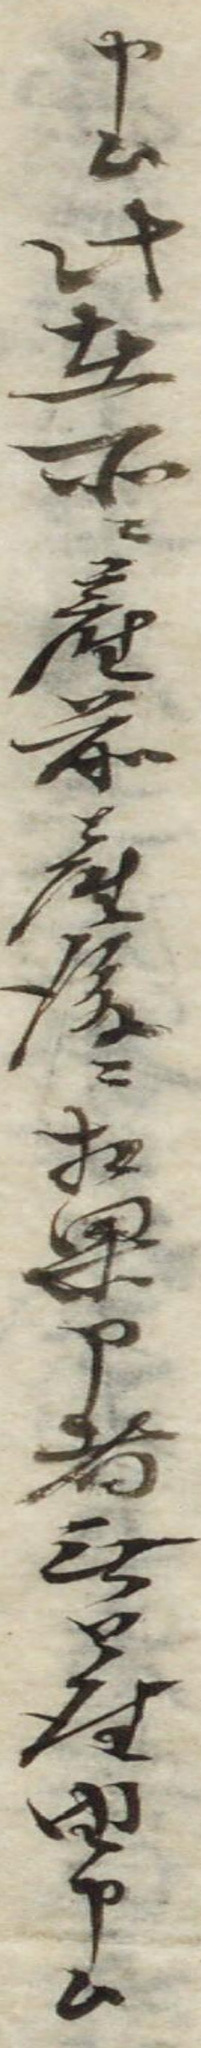申候此在所に産前産後に相果申者無御座由申候
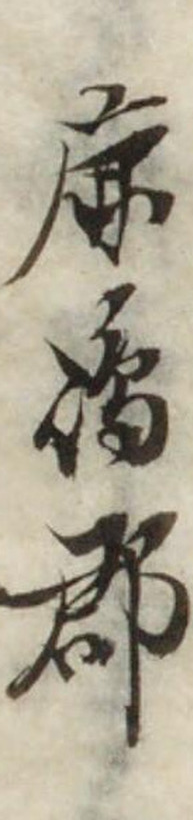鹿嶋郡
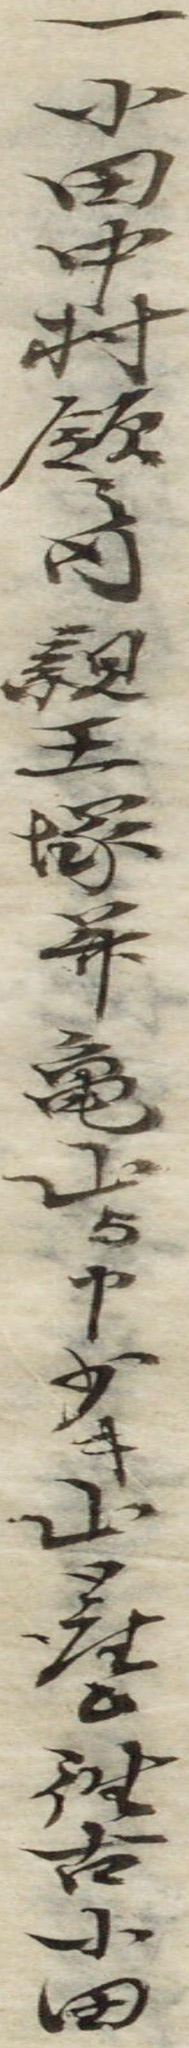一小田中村領之内親王塚并亀山と申少キ山御座候往古小田
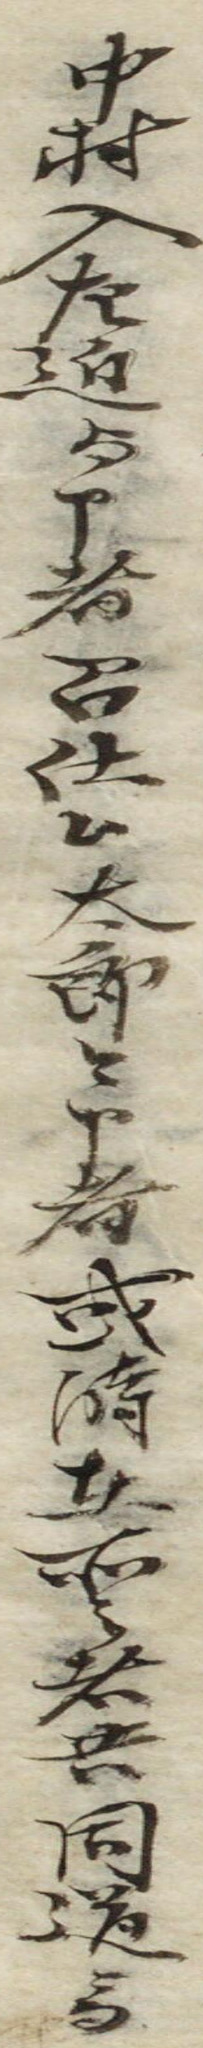中村入左近と申者召仕候太郎と申者或時在所之者共同道ニ而
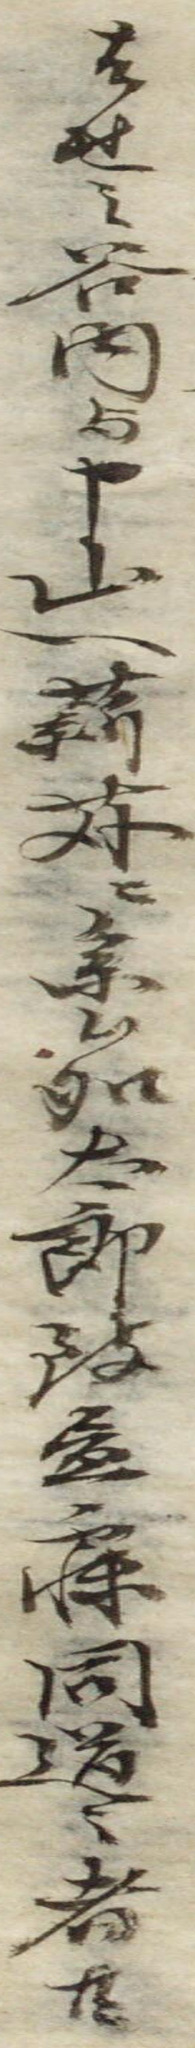はせ之谷内と申山へ薪苅に参候処太郎致昼寝同道之者共
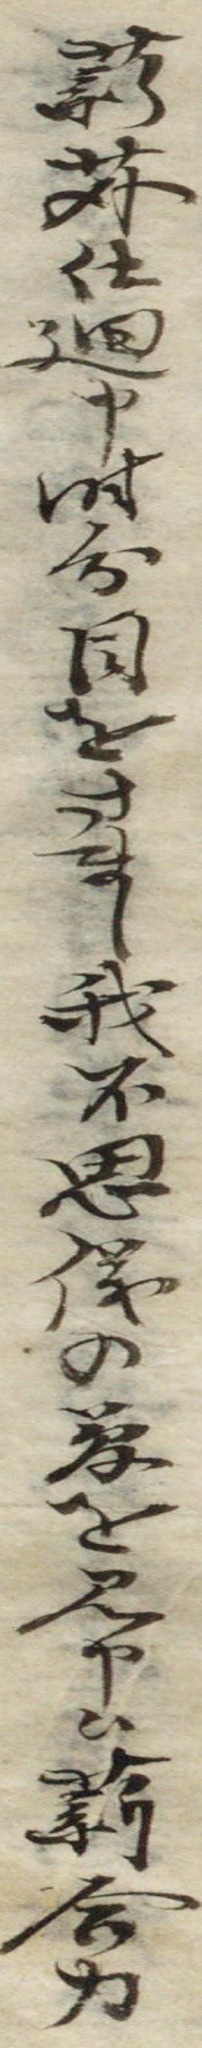薪苅仕廻申時分目をさまし我不思儀の夢を見申候薪合力

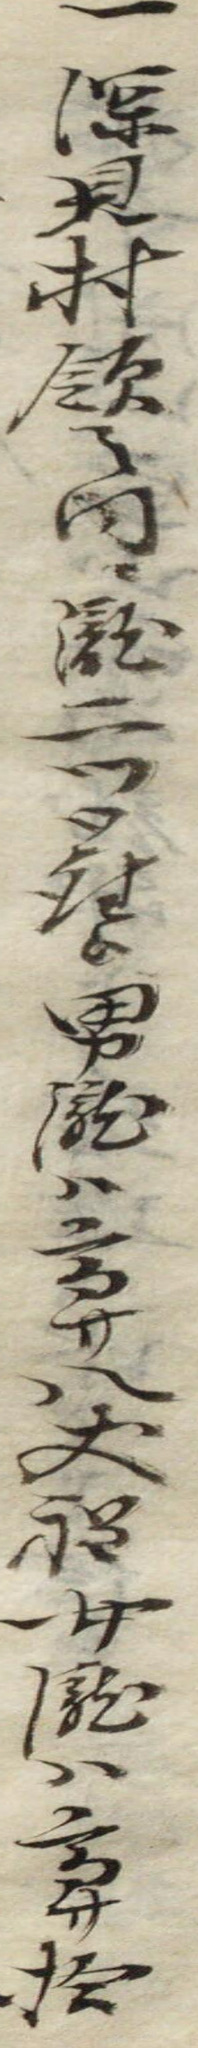一深見村領之内に瀧二ッ御座候男瀧は高さ八丈程女瀧は高さ拾
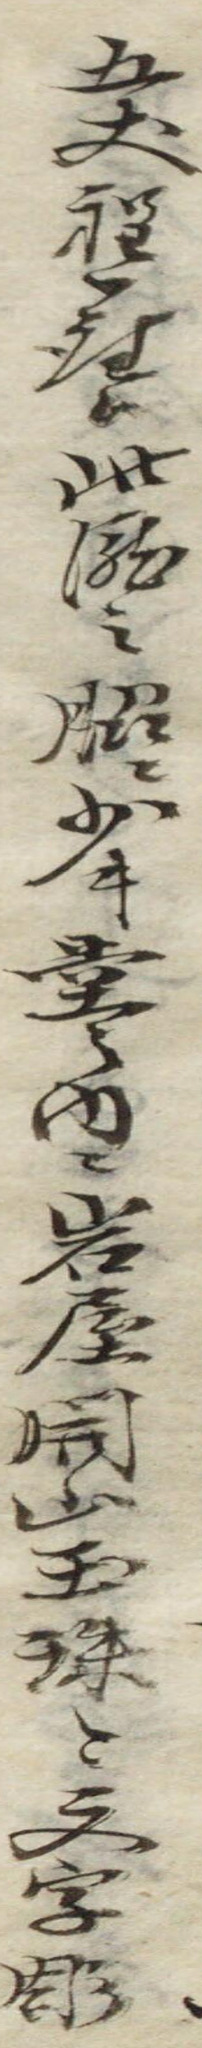五丈程御座候此瀧之脇に少き堂之内に岩屋開山玉珠と文字彫
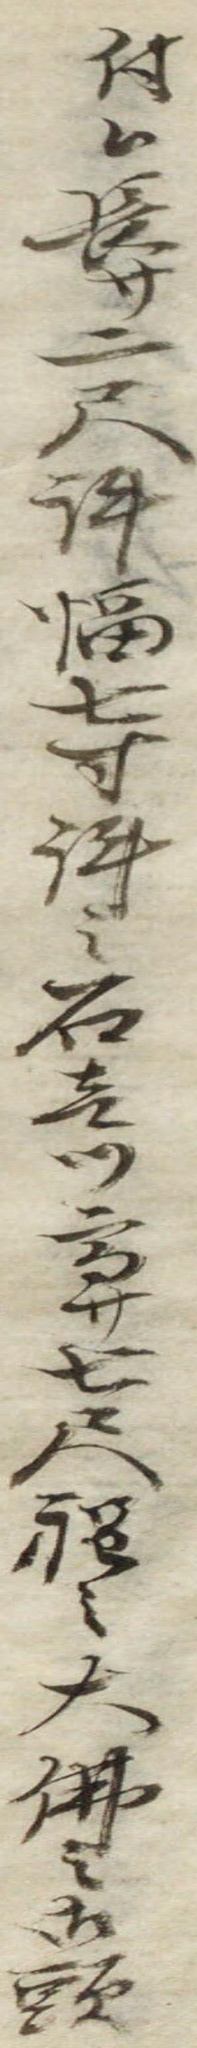付候長さ二尺許幅七寸許之石壱ッ高さ七尺程之大仏之御頭
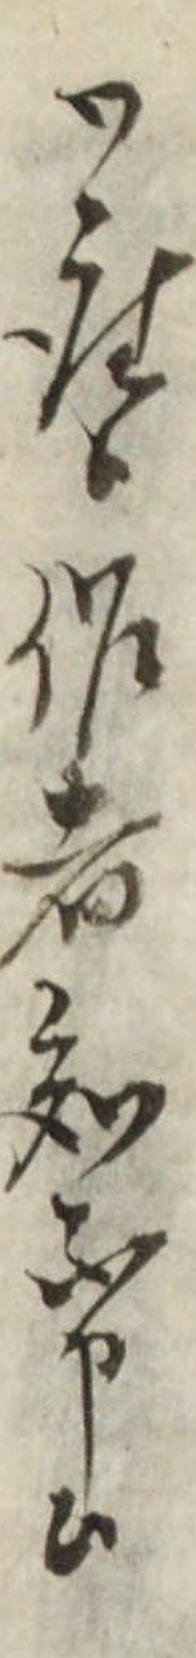御座候作者知不申候
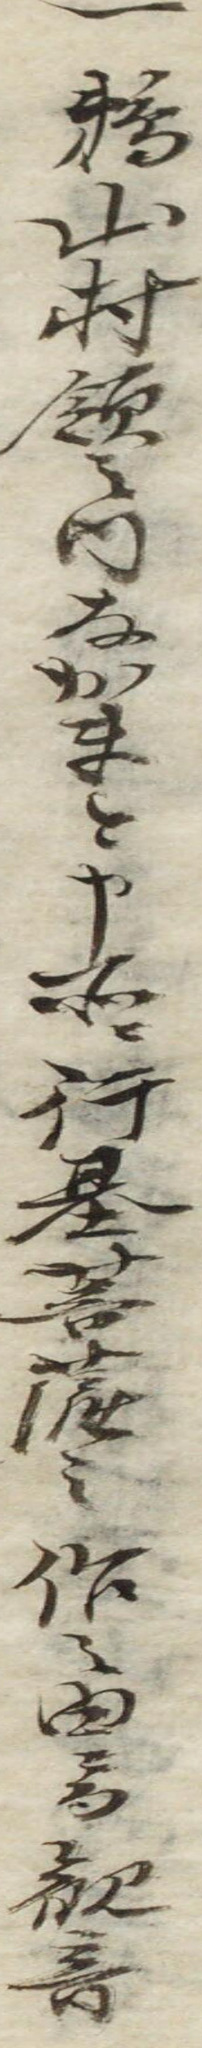一鵜山村領之内なかまと申所に行基菩薩之作之由に而観音
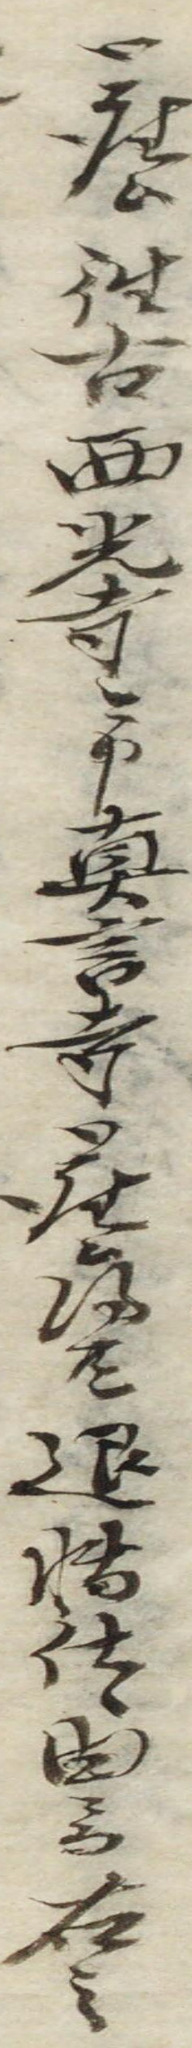御座候往古西光寺と申真言寺御座候得共退転仕候由に而右之
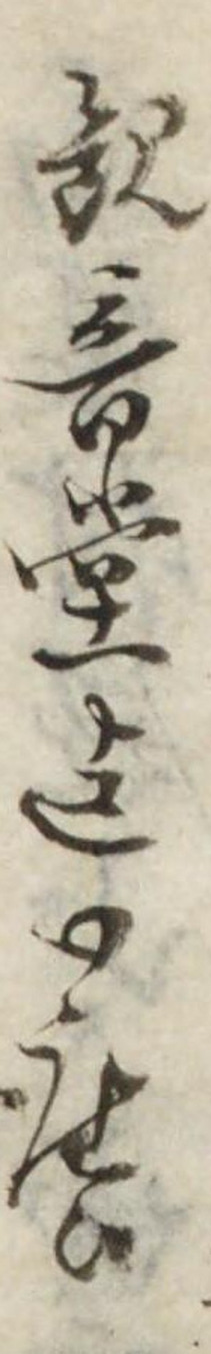観音堂迄御座候
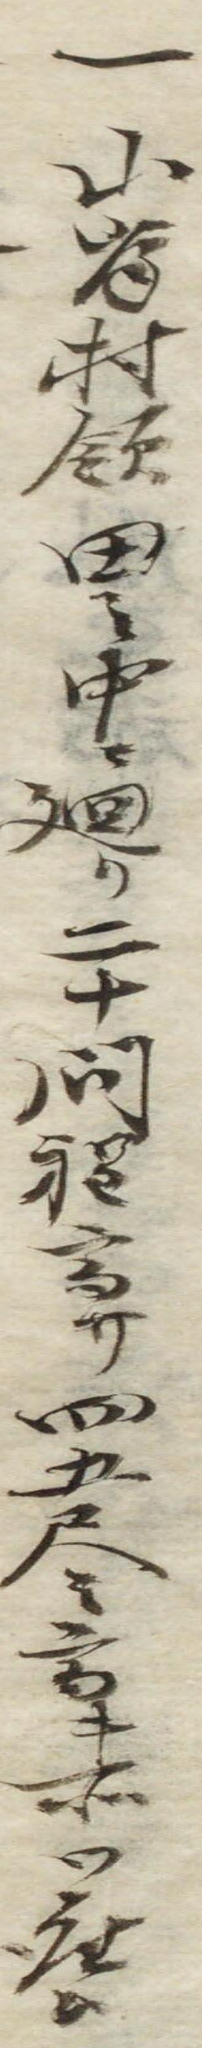一山岸村領田之中に廻り二十間程高さ四五尺之高き所御座候
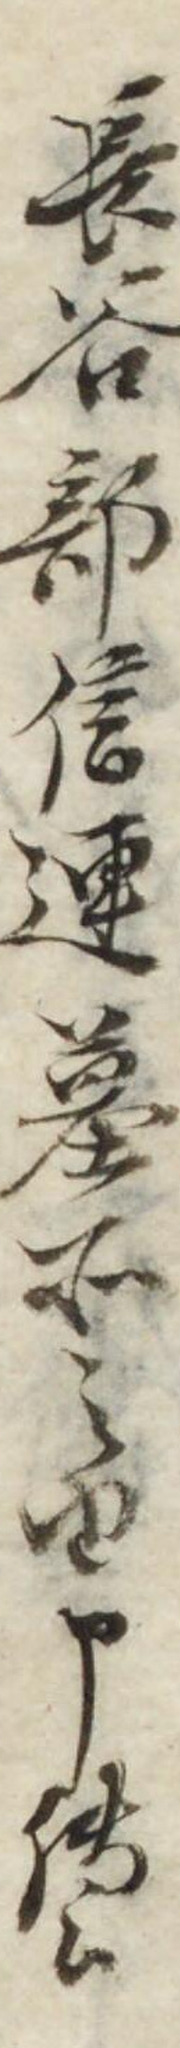長谷部信連墓所之由申伝候
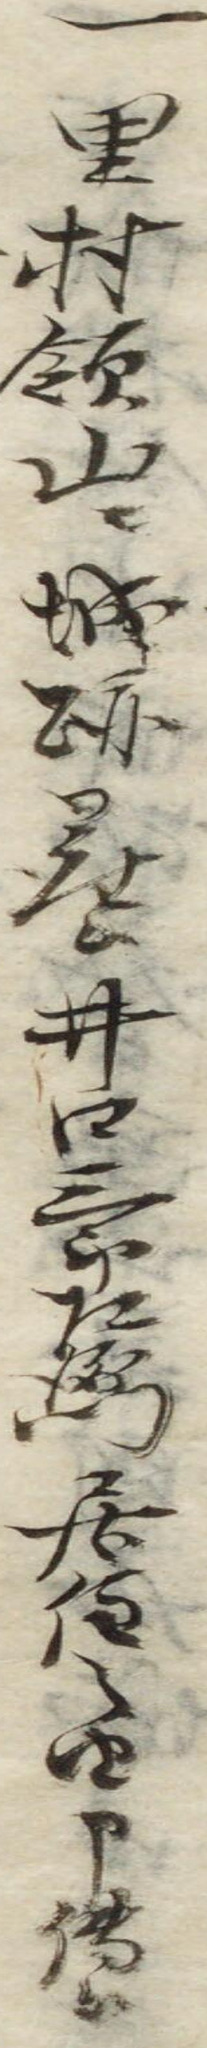一里村領山に城跡御座候井口三郎左衛門居住之由申伝候
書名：加越能旧聞録
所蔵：Ishikawa Prefectural Library
